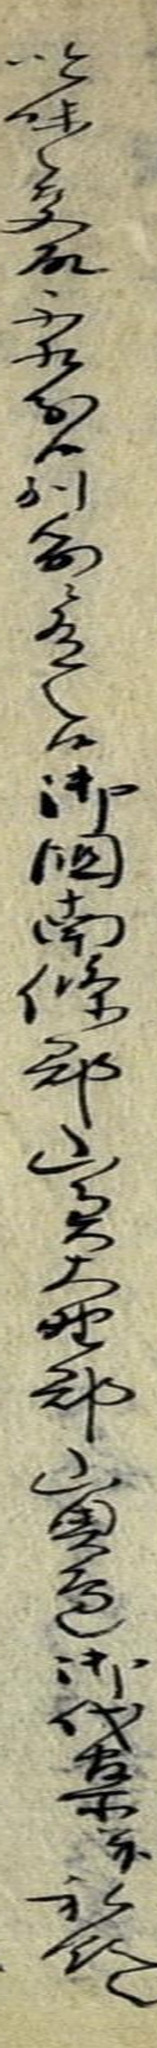吟味之事故不相分候別紙ニ有之候御国南条郡山奥大野郡山奥辺御代官所并私領之
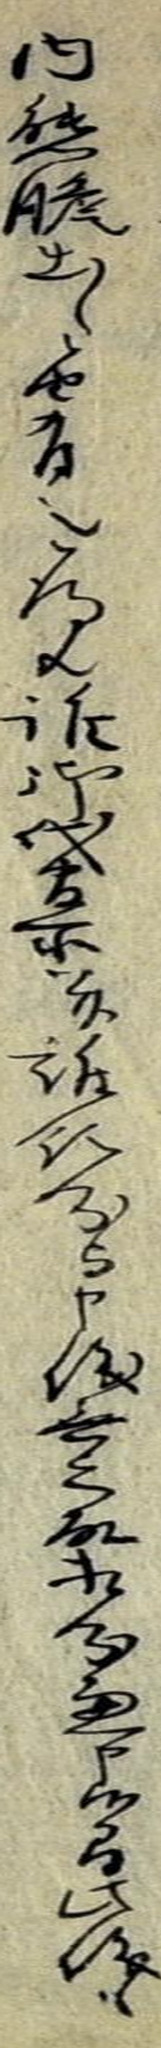内熊膽出し候由有之候得共誰御代官所并誰領分与申儀無之故相分兼申候間此儀も
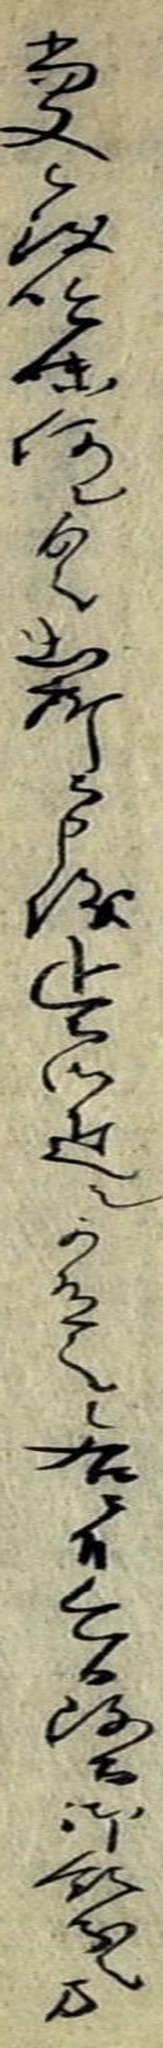尚又被致吟味何レゟ之出所与申儀追而御達シ可有之候右ニ付今日改而御領分之方
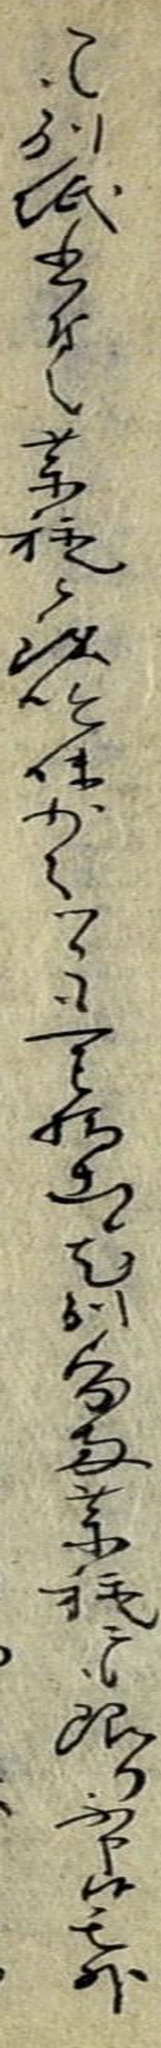へも別紙書付之薬種被致吟味少々ツヽも可被指出候尤別紙両薬種ニも限り不申候其外
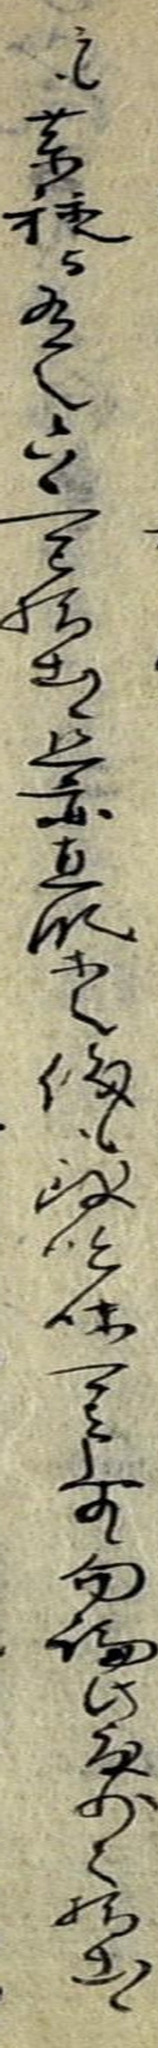ニも薬種与有之候ハヽ可被指出候且亦直段等之儀も致吟味可被申聞候勿論此度少々指出候
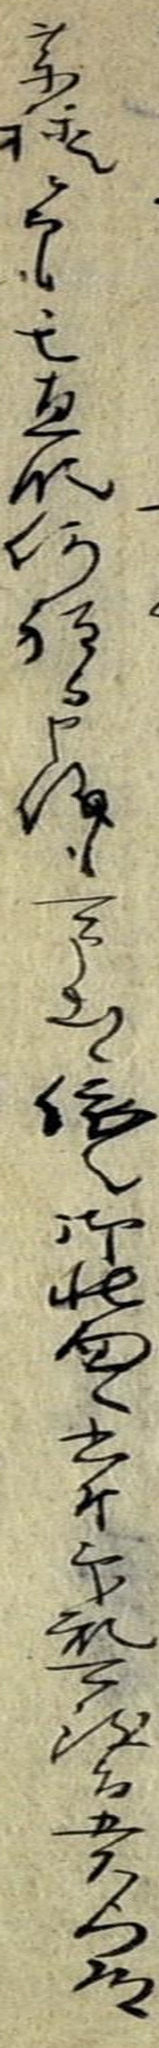薬種ニ而も其直段何程与申儀も可申出候依之御帳面へ書付印形可致旨五右衛門殿
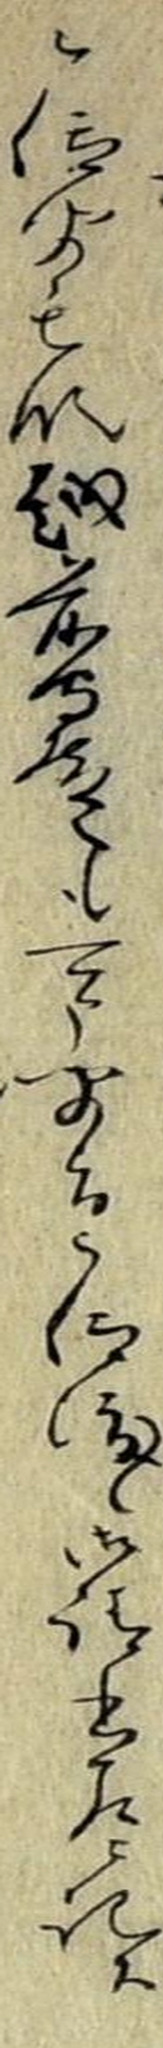被仰聞其段越前守殿へも可申聞旨被仰渡候御請書左ニ記ス
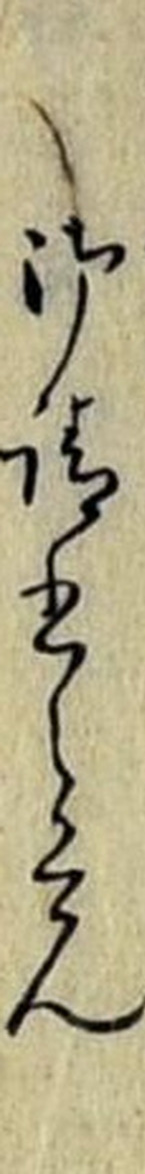御請書之覚
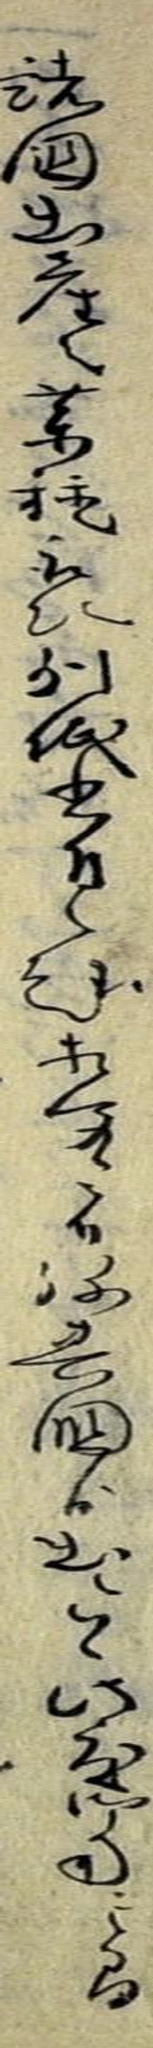諸国出産之薬種取次別紙書付之趣相聞候ニ付弥其国ゟ出候ハヽ此度御用ニ候間
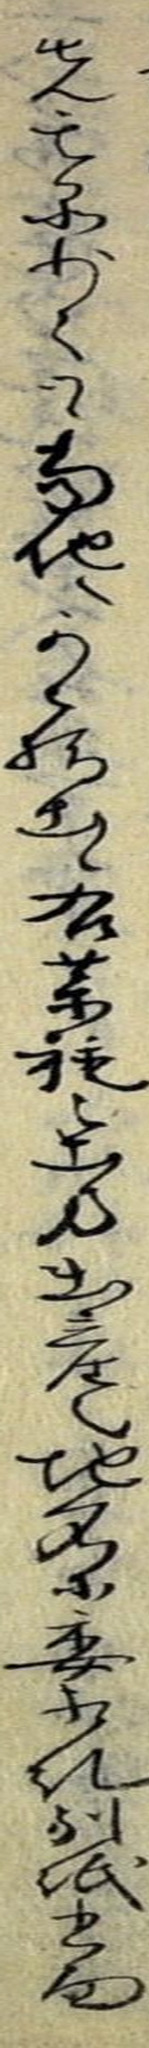先其品少々ツヽ当地へ可被指出候右薬種之出方出産之地名等委相糺別紙書面
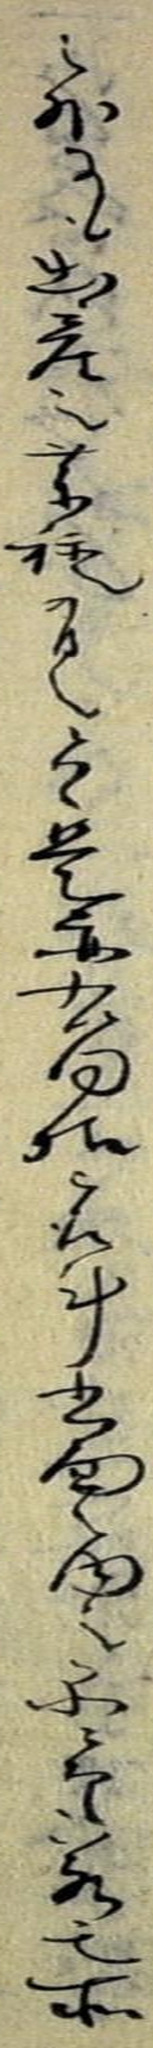之外にも出産之薬種有之候ハヽ是亦右同様被取計書面之内之品ニ而も若其品
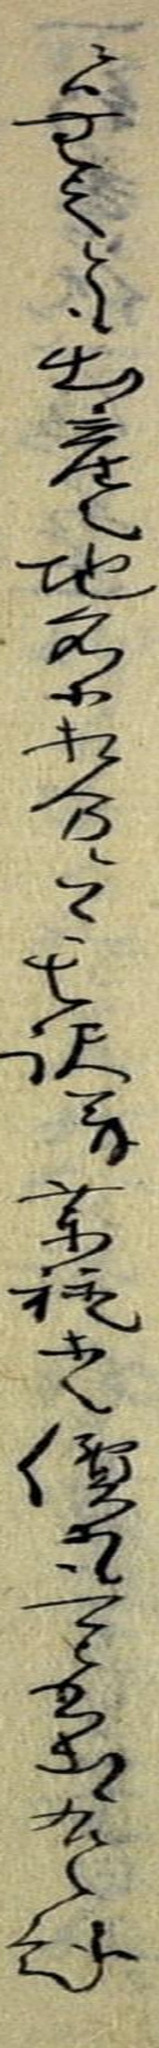ニハ無之とも出産之地名等相分候ハヽ其訳并薬種等之価等も可被書出候右之趣
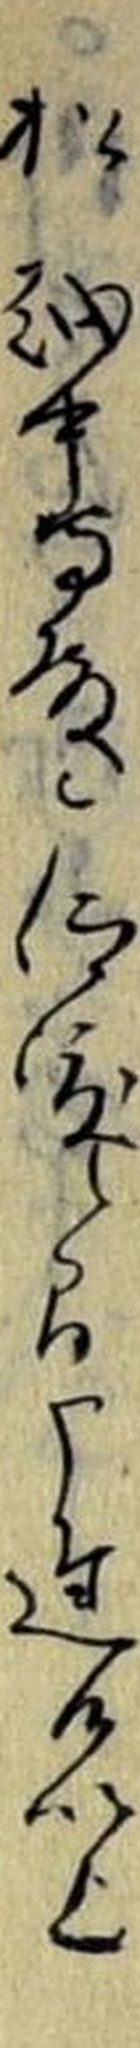於越中守殿被仰渡候間申達候以上
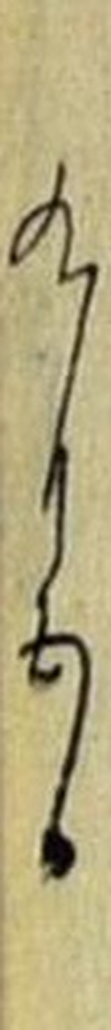九月五日
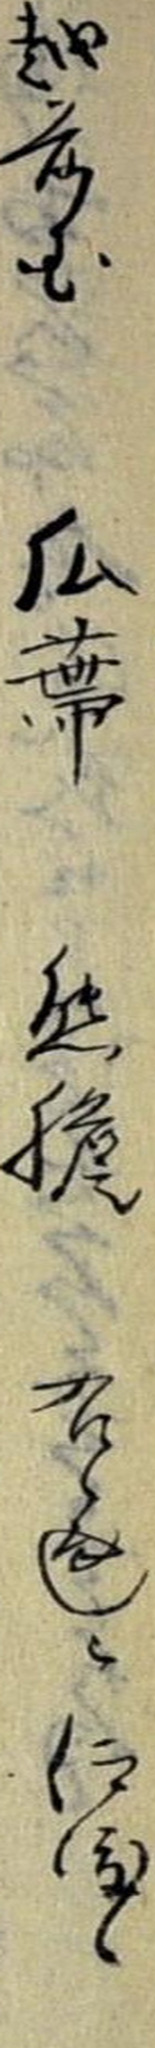越前国瓜蒂熊膽右之通被仰渡候
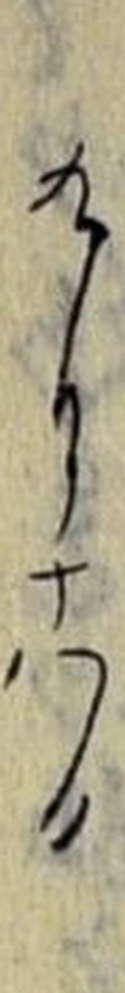九月十八日
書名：命令之部 三
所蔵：福井県文書館 Fukui Prefectural Archives
